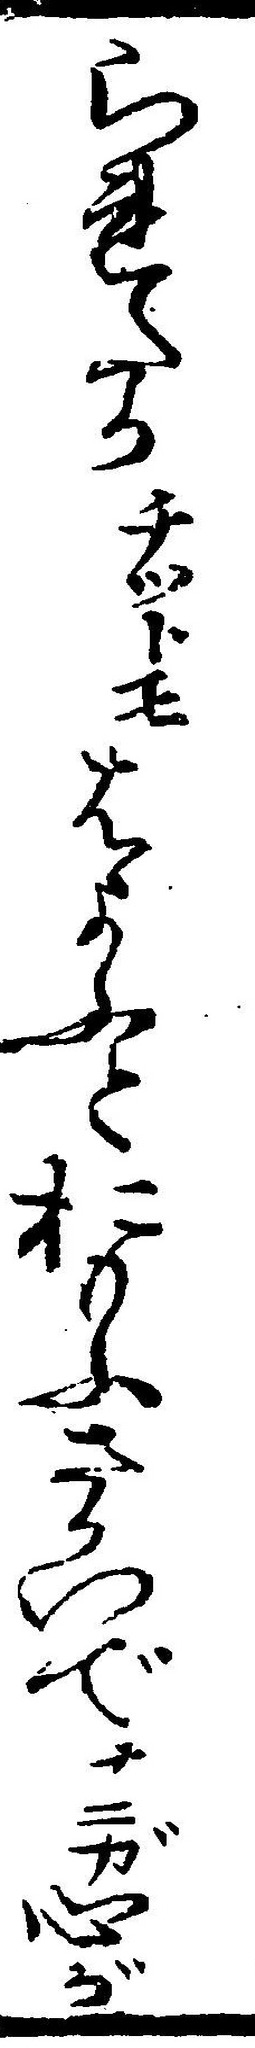られたりチツトモはよふとおもふさかいでナニガ心が
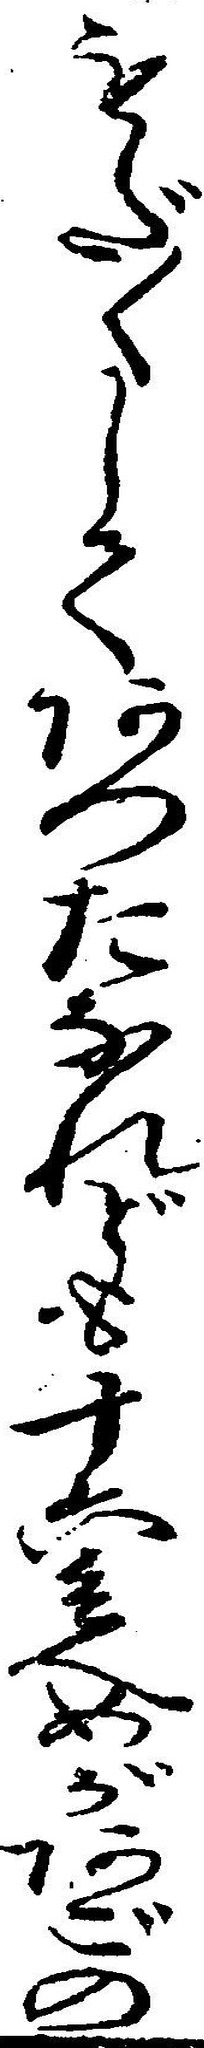もだ〳〵してあつたなれども十六兵衛めがあごの
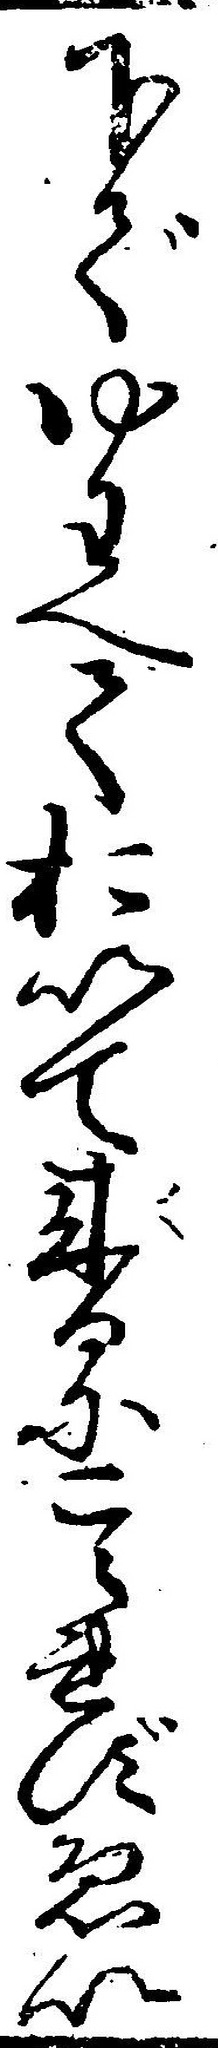下でゆわへておいて来るにこられずゑい
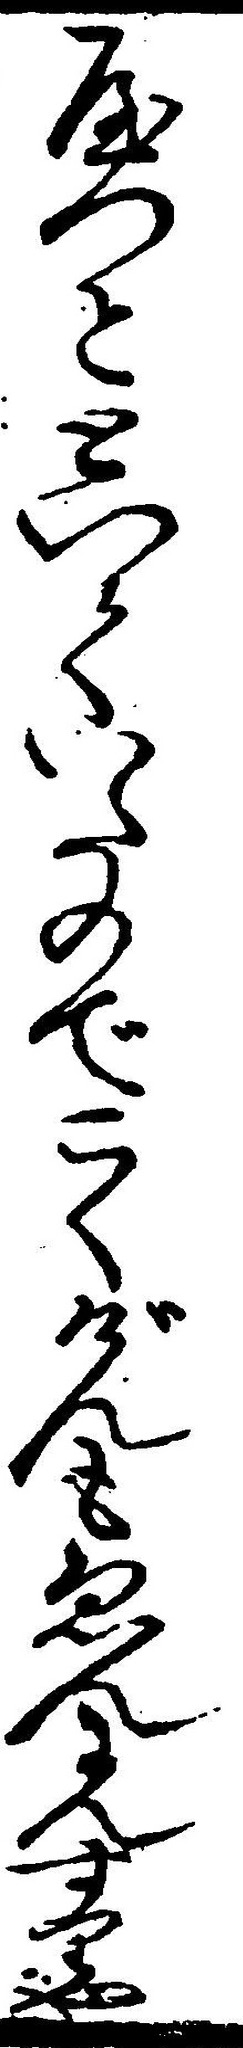やつとといていたのでこくげんもゑんにんすりや

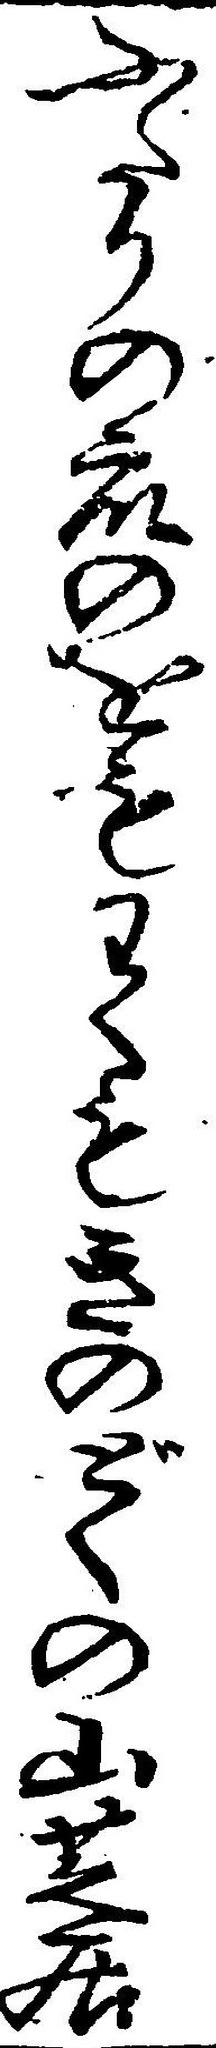ふたりの衆のをもわくもきのどくの山芝居
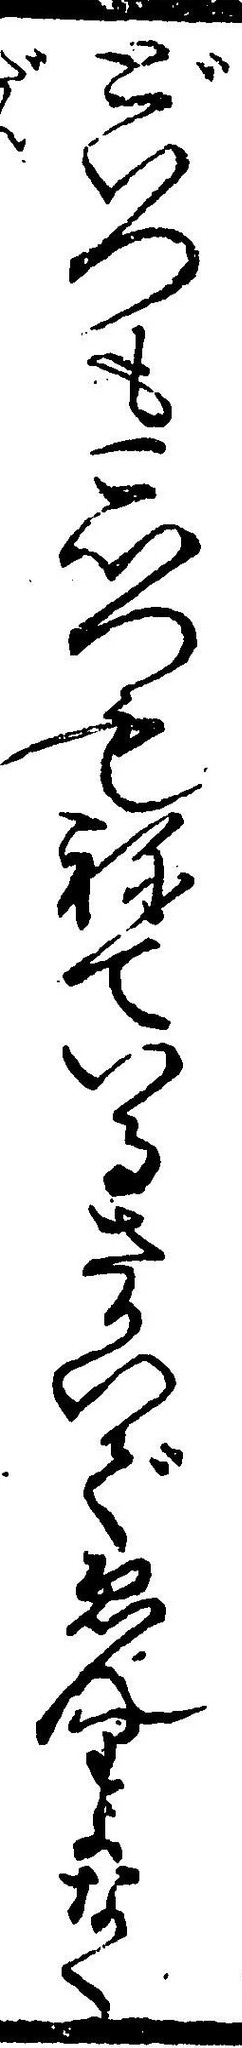どいつもこいつもねているさかいでゑんりよなく
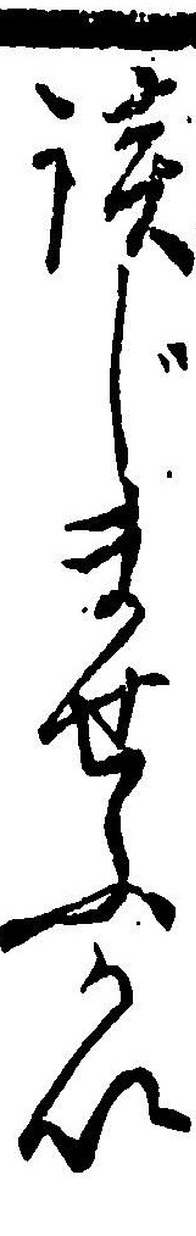談じませふかい
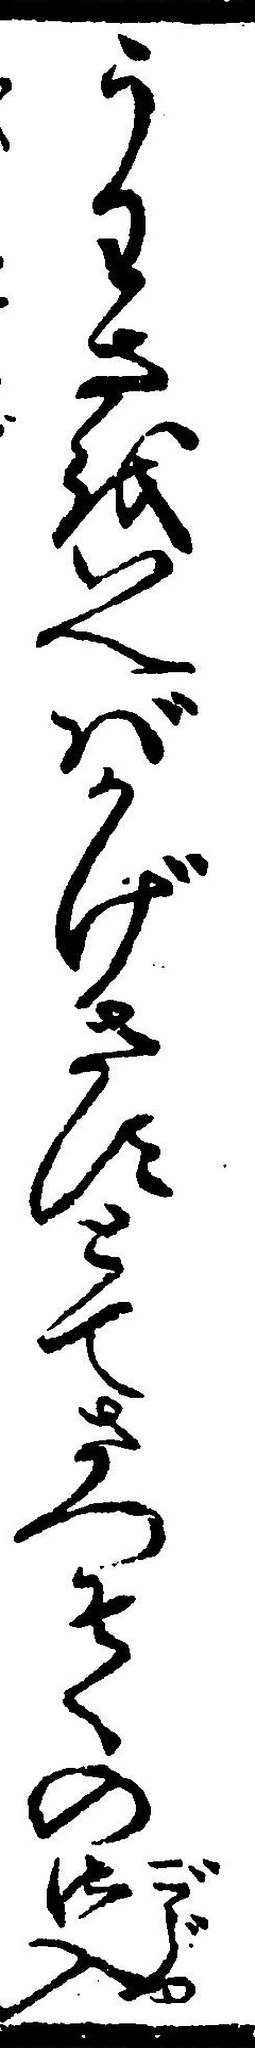うわさをいへばかげさすとてさつそくの御入
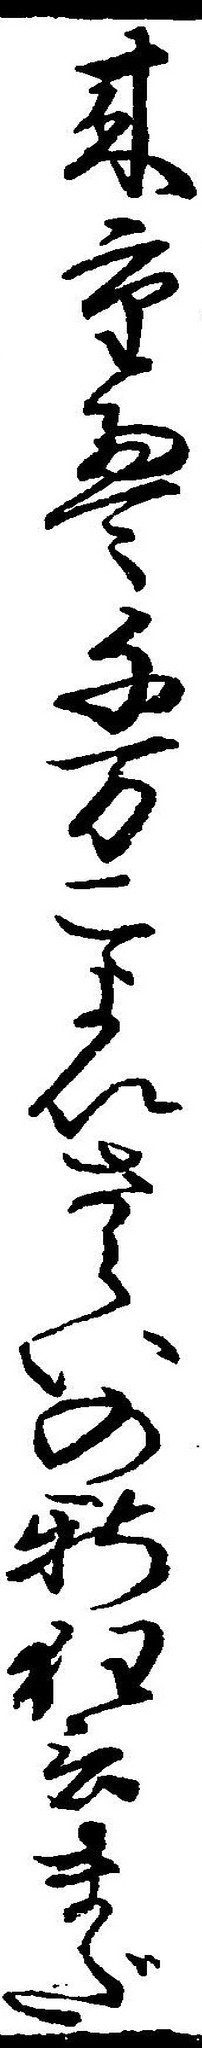来重畳千万こよいさらいの新狂言まだ
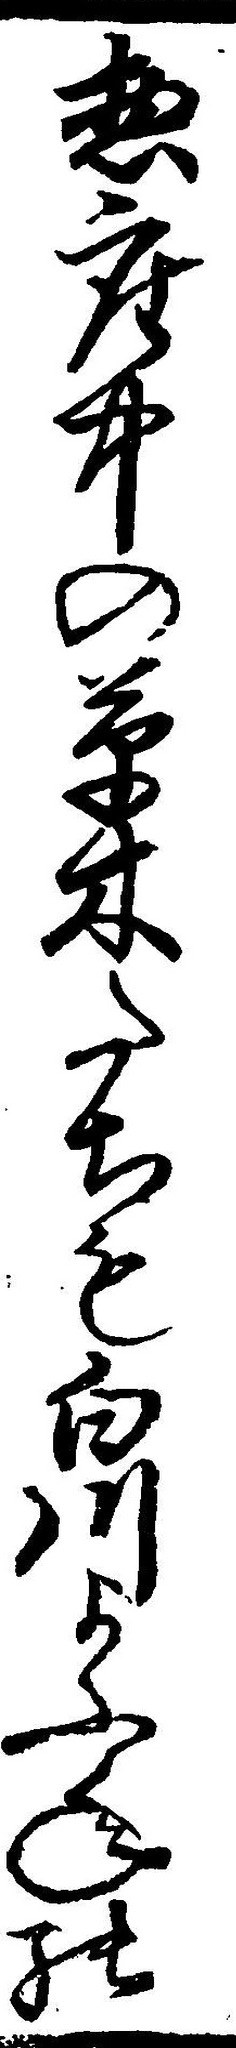惣座中の草木たちも白川よふねの
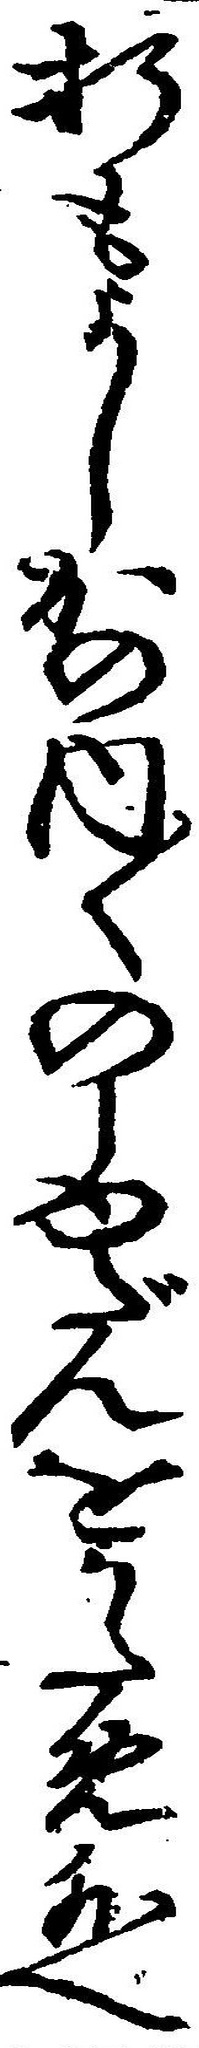折もよしかの内〳〵のしゆだんをかため外へ
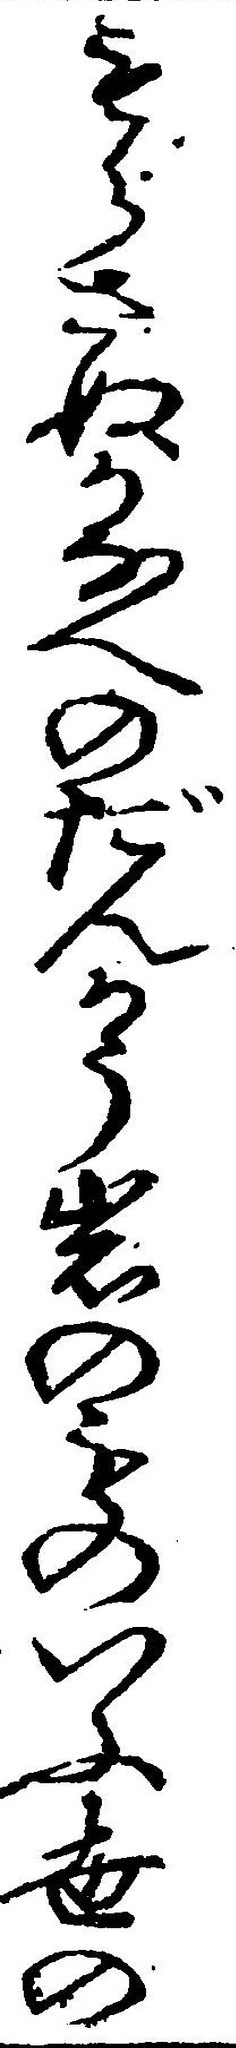もらさぬかなへのだんかう岩のものいふ世の
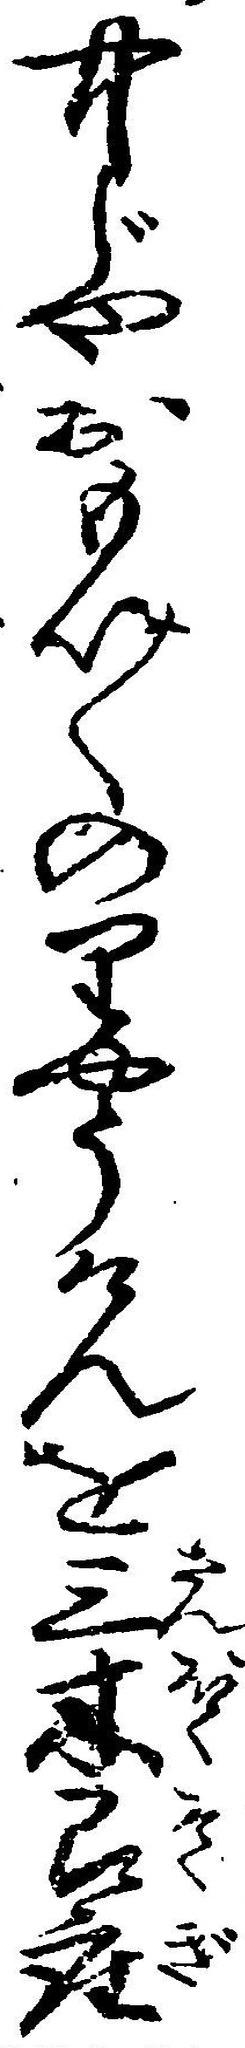中じやおもい〳〵のりやうけんを三木即座
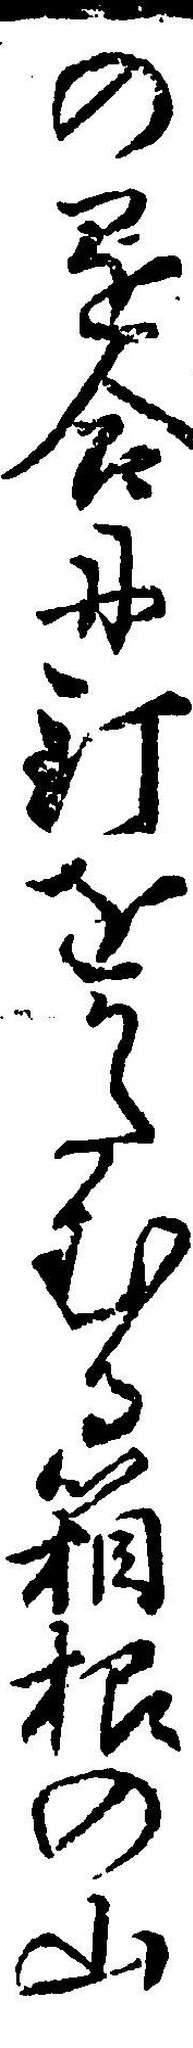の懸合に釘をかたむる箱根の山
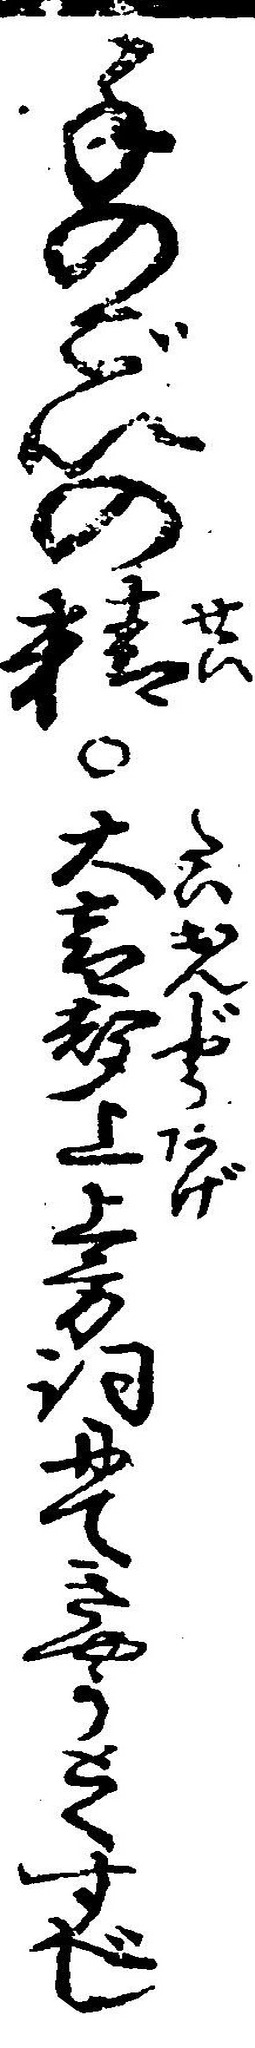手のごいの精○大音声上上方詞にてきやうとくすべし
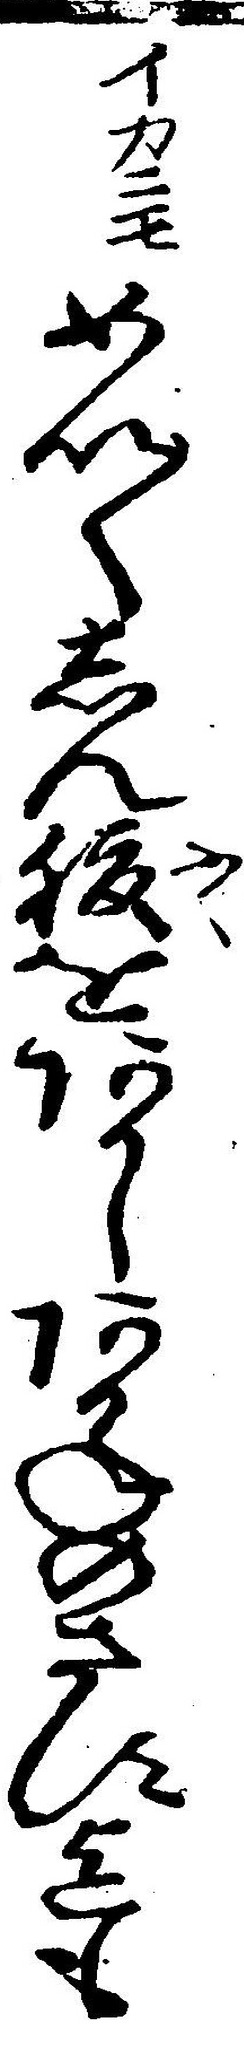イカニモめい〳〵しん腹をあかしあかねのさす迄も
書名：草木芝居化物退治 / 泉花堂三蝶(十六兵衛)作
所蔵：東京大学総合図書館 General Library in the University of Tokyo, JAPAN
